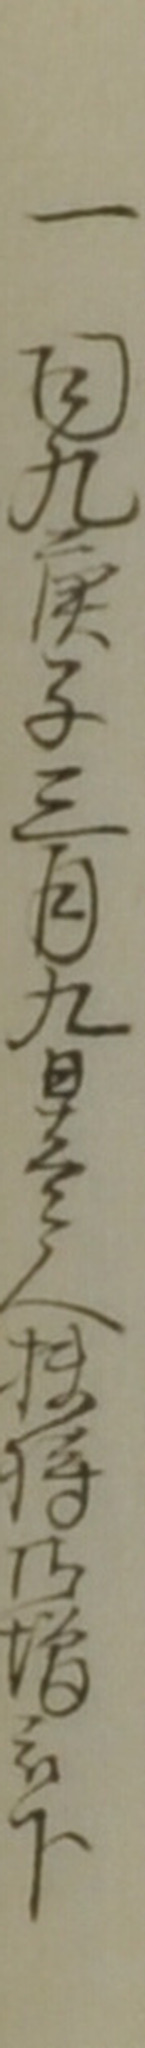一同九庚子三月九日壱人扶持御増被下
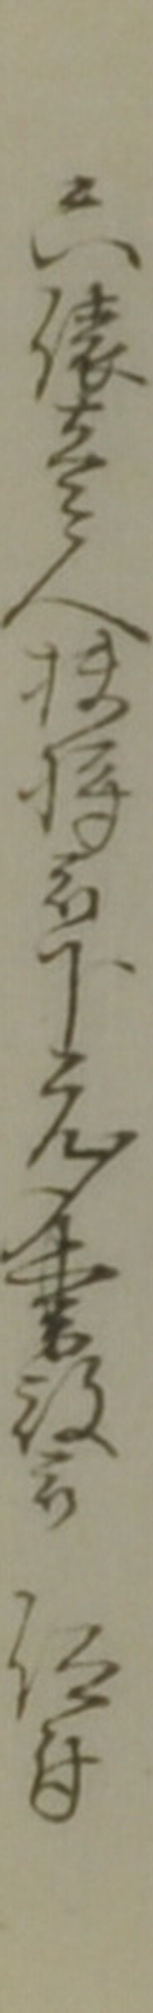六俵壱人扶持被下元〆書役被仰付
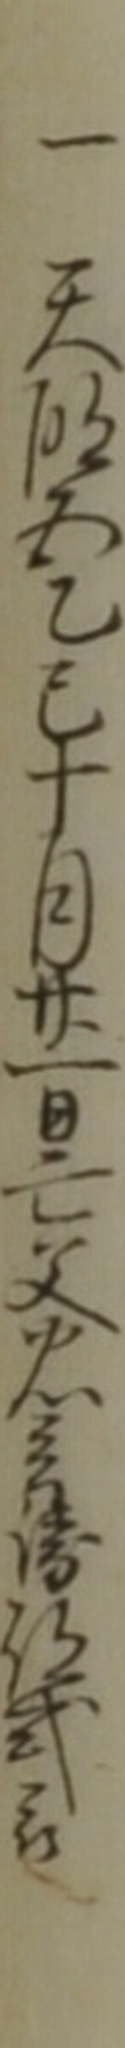一天明五乙巳十月廿一日亡父忠兵衛跡式被
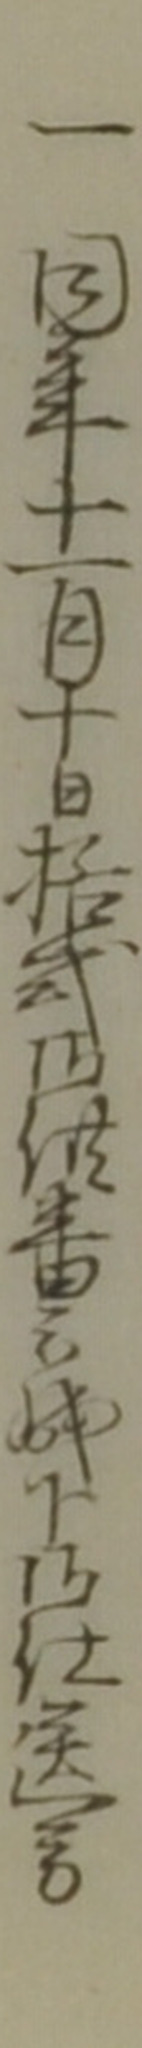一同年十一月十日格式御供番被成下御仕送方
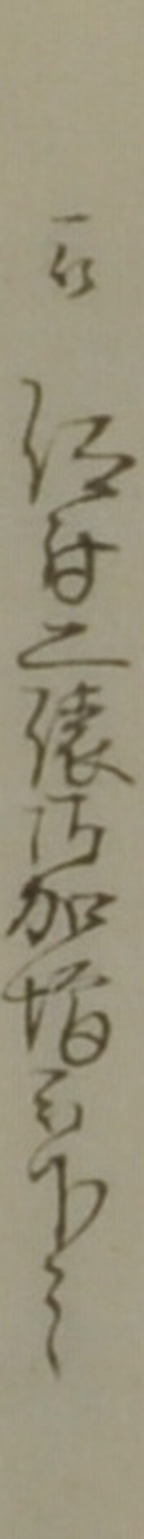被仰付二俵御加増被下之
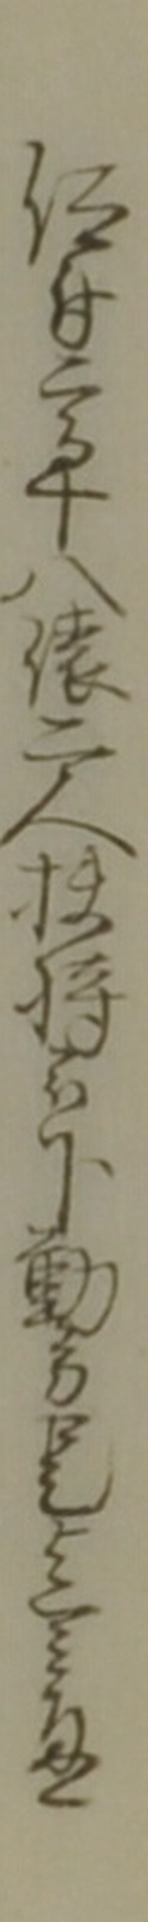仰付高十八俵二人扶持被下勤方是迄之通

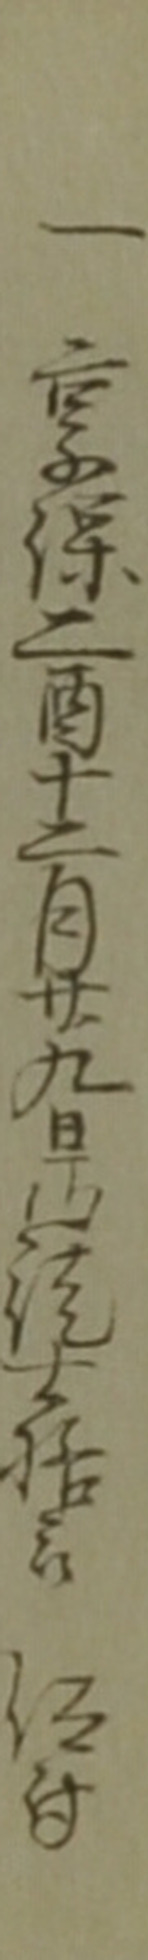一享保二酉十二月廿九日御徒士格被仰付
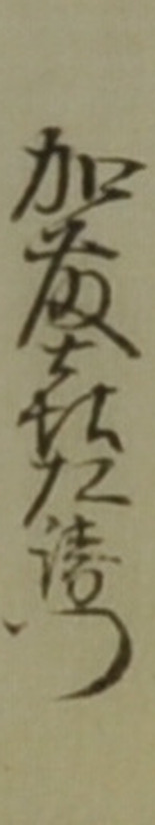加藤喜左衛門
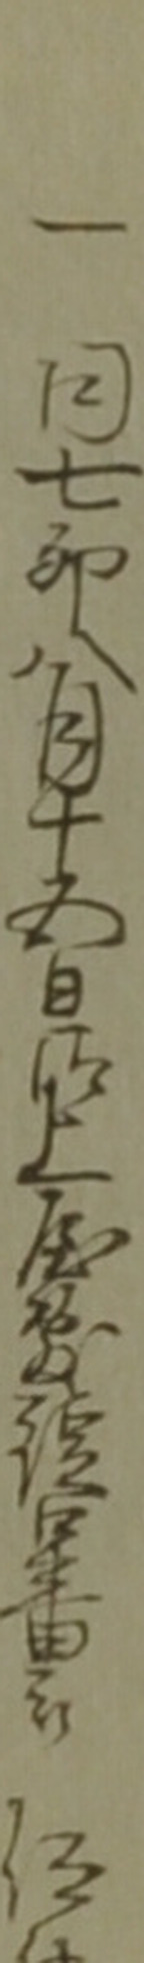一同七卯八月十五日御上屋敷錠口番被仰付
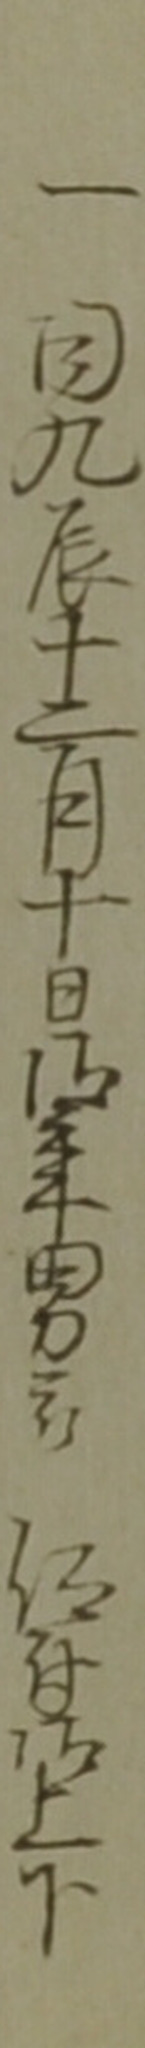一同九辰十二月十日御年男被仰付御上下
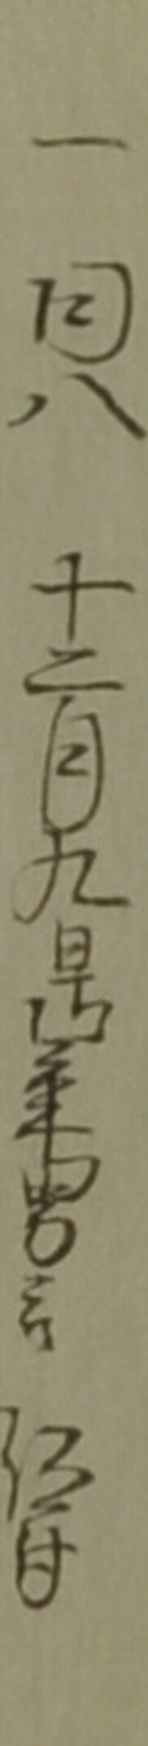一同八十二月九日御年男被仰付
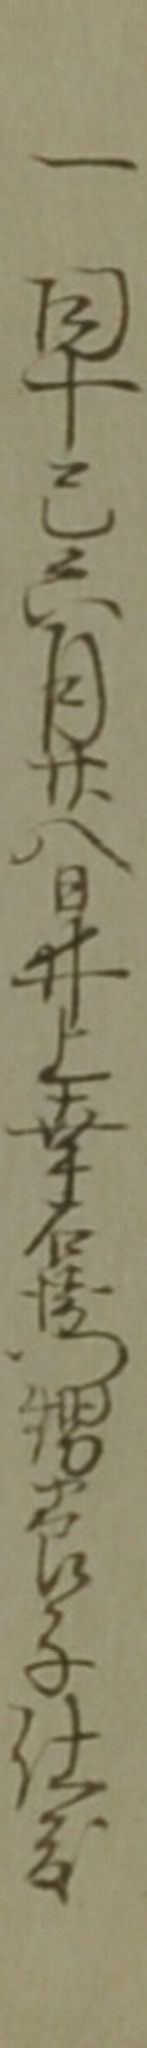一同十巳六月廿八日井上幸右衛門甥養子仕度
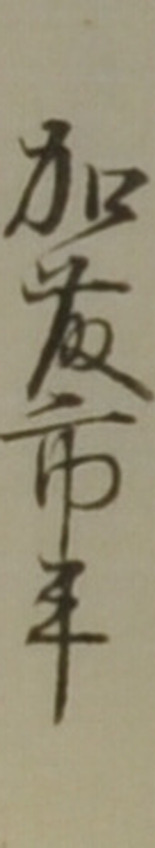加藤市平
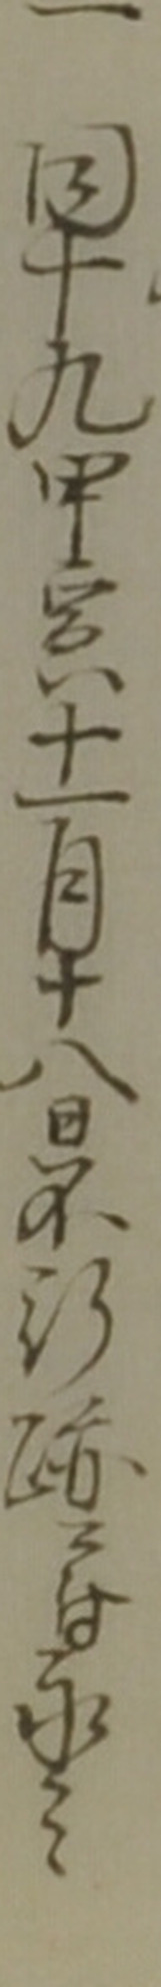一同十九甲寅十一月十八日不行跡ニ付永之
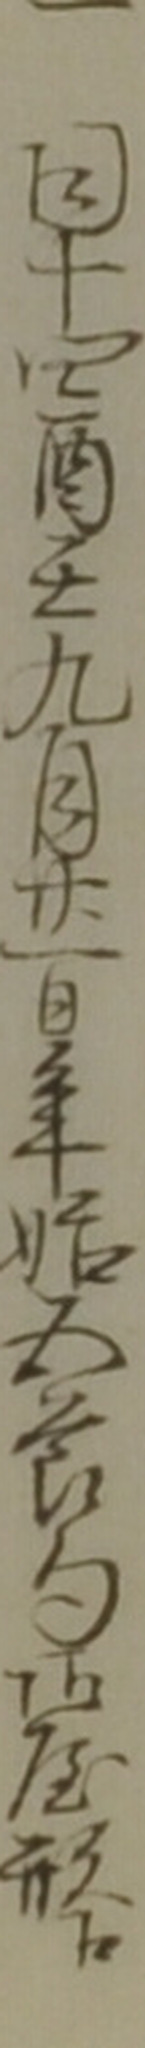一同十四酉閏九月廿一日年始五節句御屋形江
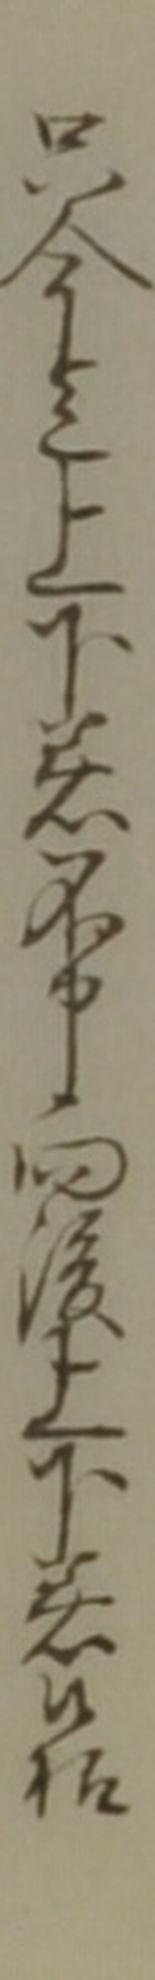只今迄上下着不申向後上下着候様
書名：無足廃家（壱）
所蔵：伊那市立高遠町図書館・合同会社AMANE
